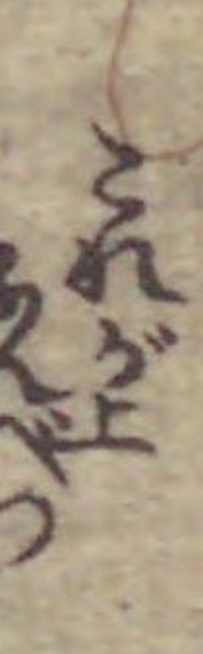これが上
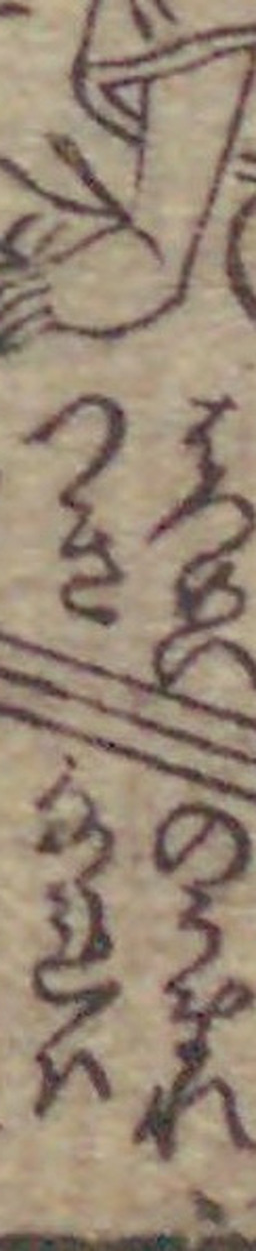つきなれば
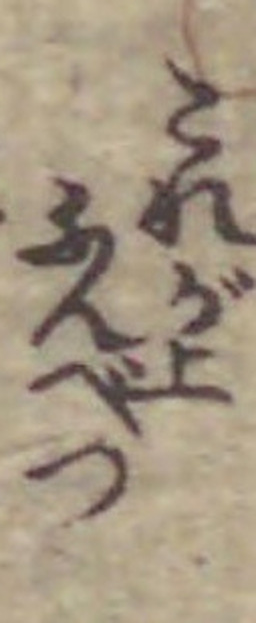ふんべつ
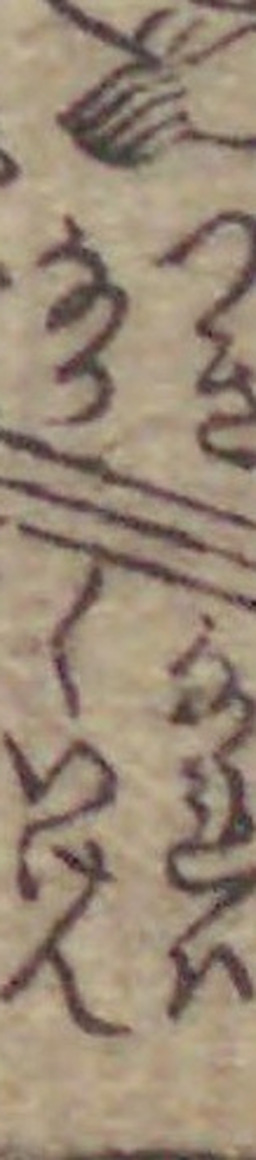なか〳〵いけん
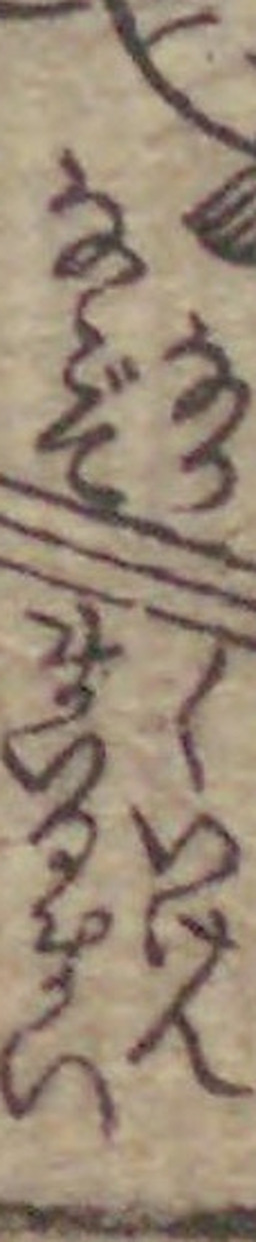などてまいるまい
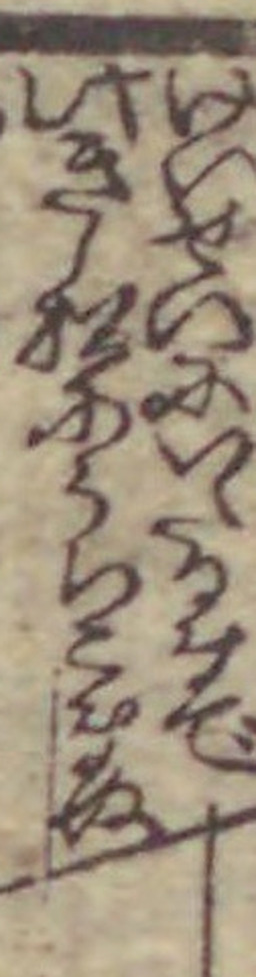此きし松にうちこまぬ
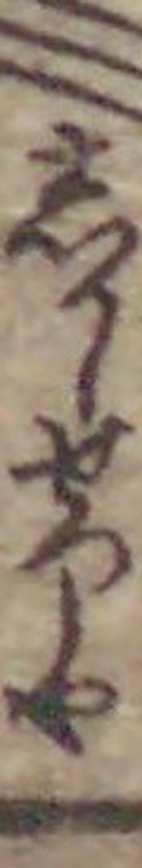しかしせつしや
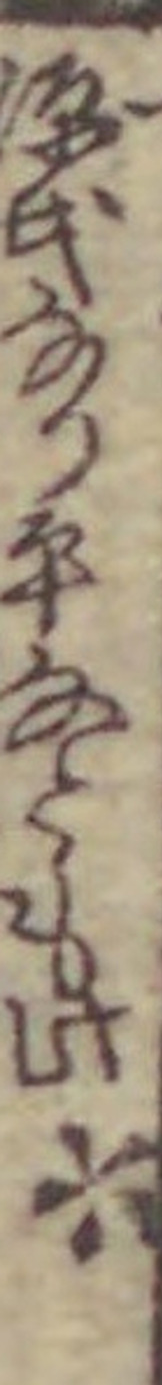源氏なり平なとも此
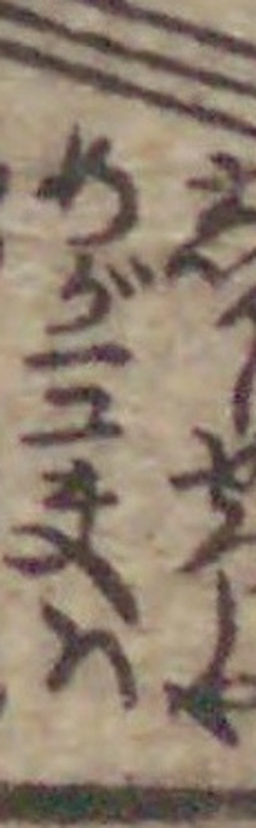めが一工夫は
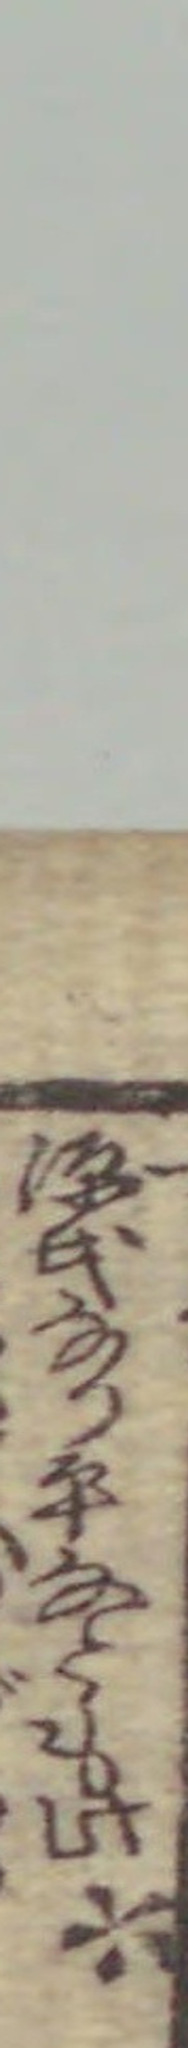源氏なり平なとも此
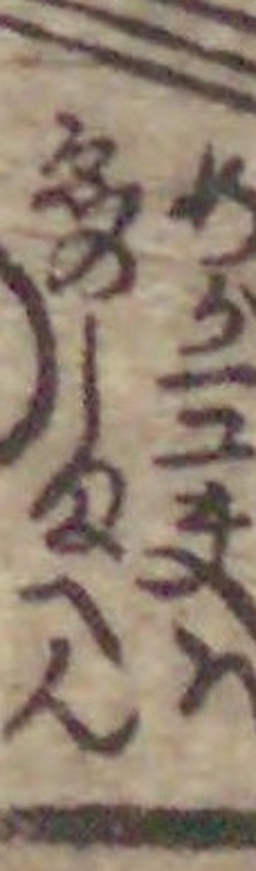ゑのしまへん
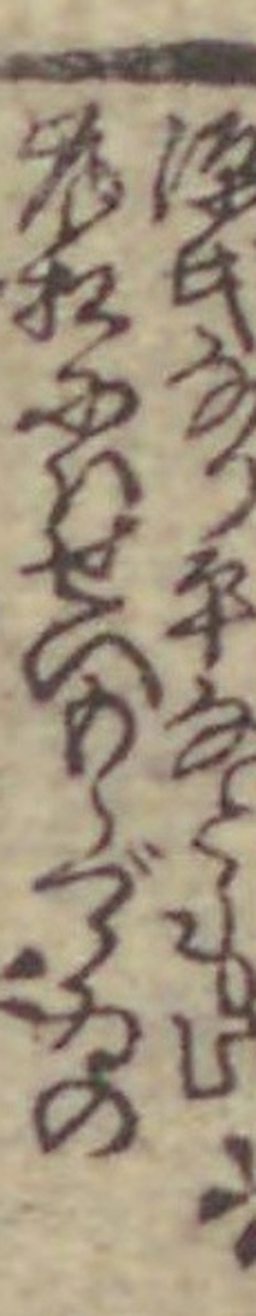岸松にはせいもうづうゐの
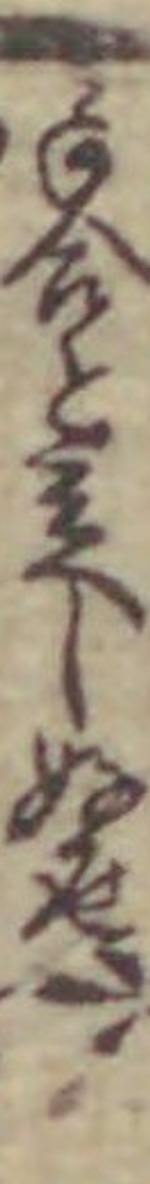手合とみへしふかせ
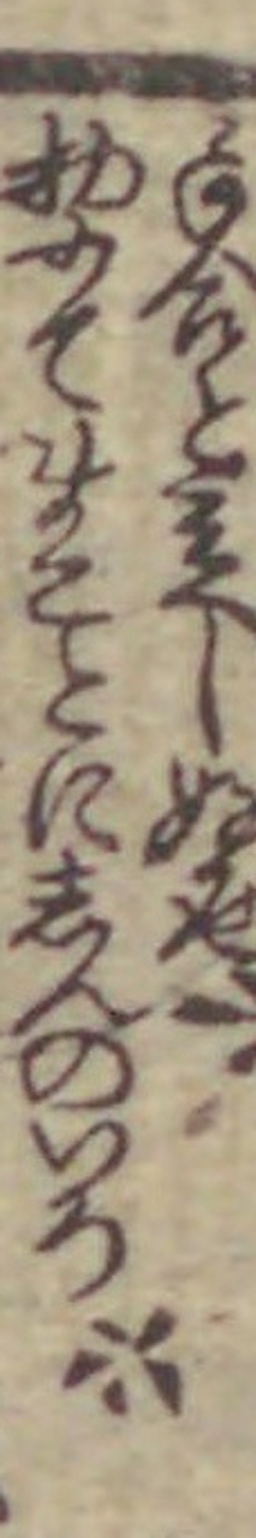物にてまことにしんのいろ
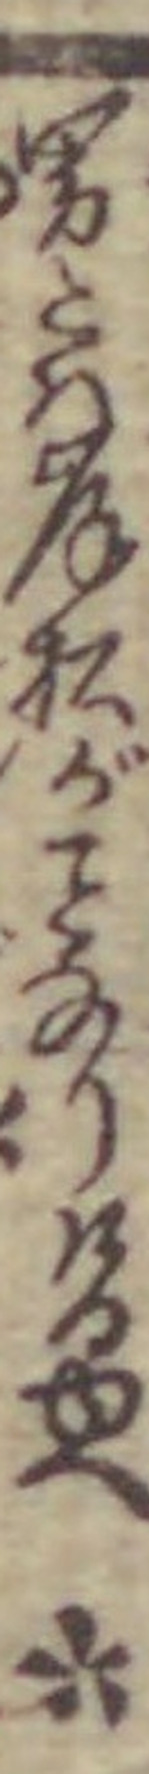男とは岸松がことなりけるゆへ
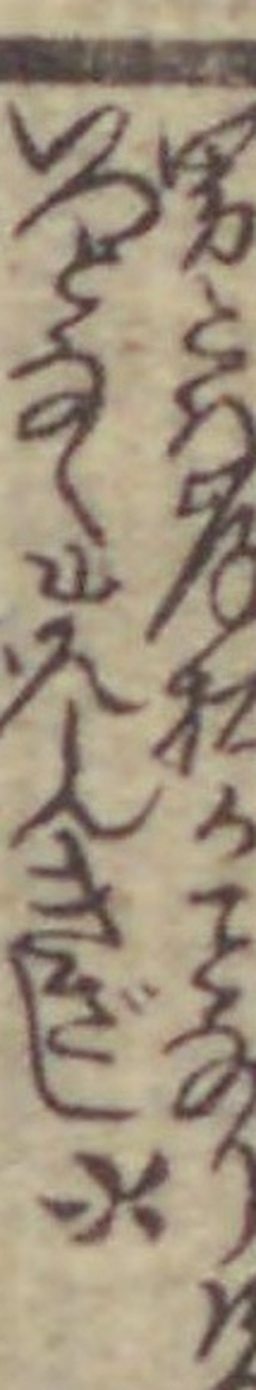いつとなくまんしんきざし
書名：止而道致虚録 3巻
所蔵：国立国会図書館 National Diet Library, JAPAN
